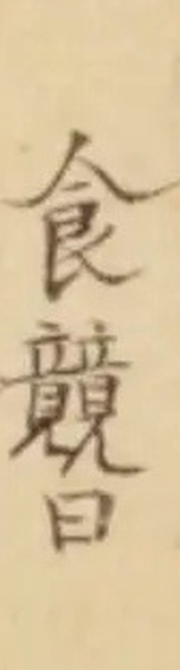食競曰
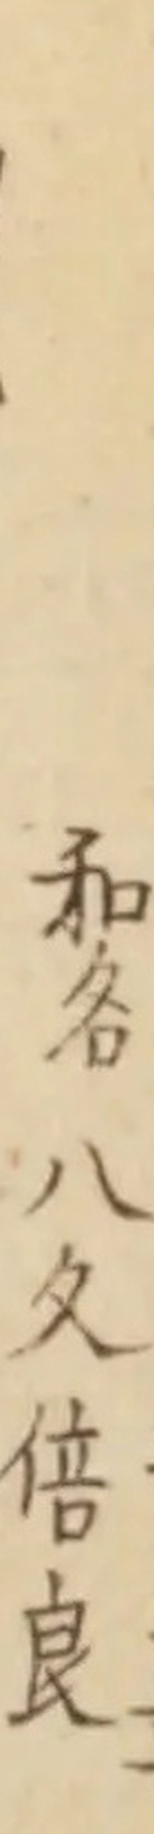和名八久倍良
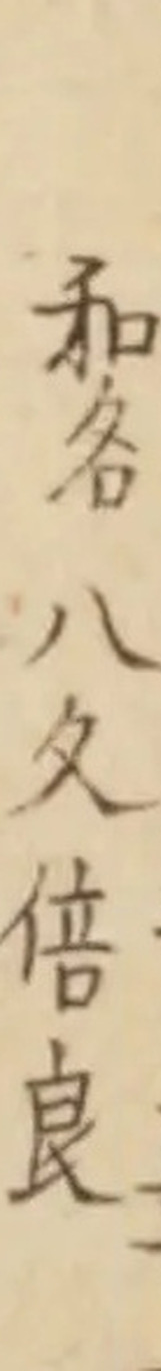和名八久倍良
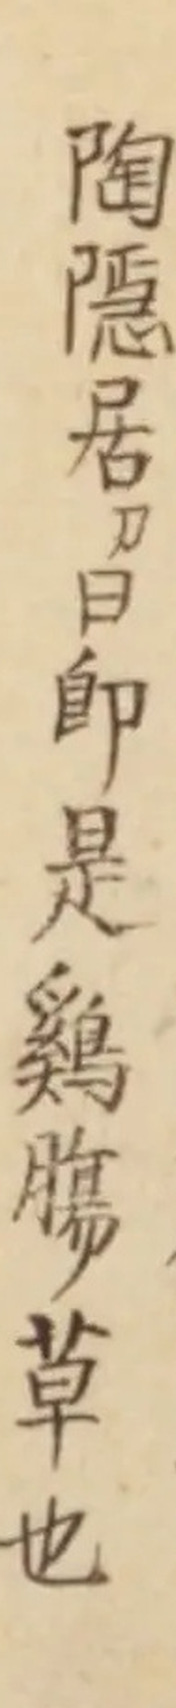陶隠居カ日即鷄腸草也
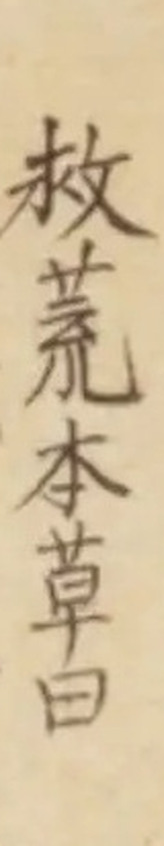救荒本草曰
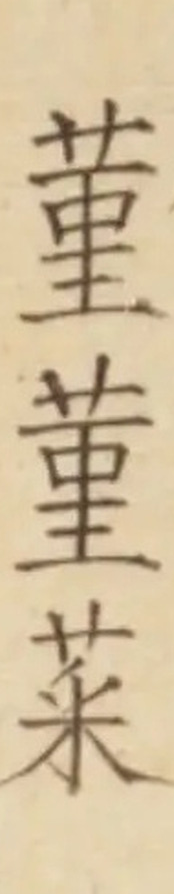菫菫菜
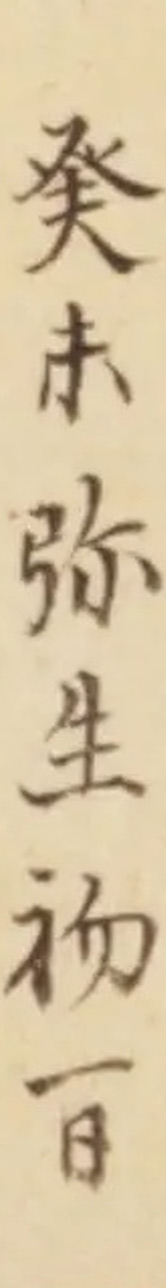癸未弥生初一日
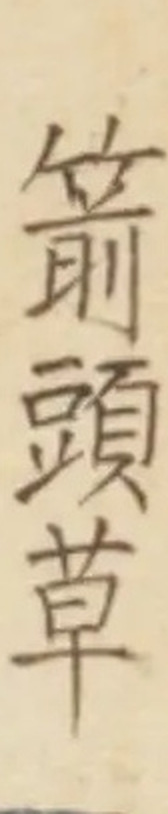箭頭草
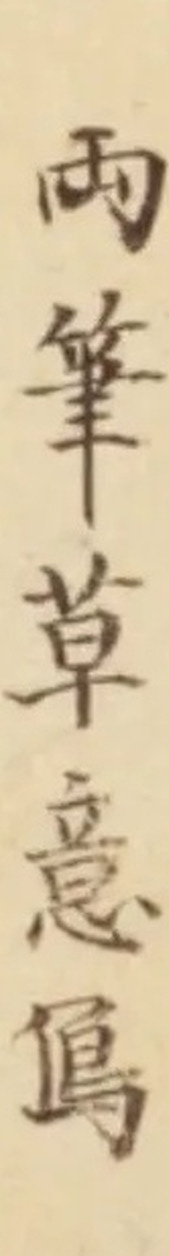両筆草意寫
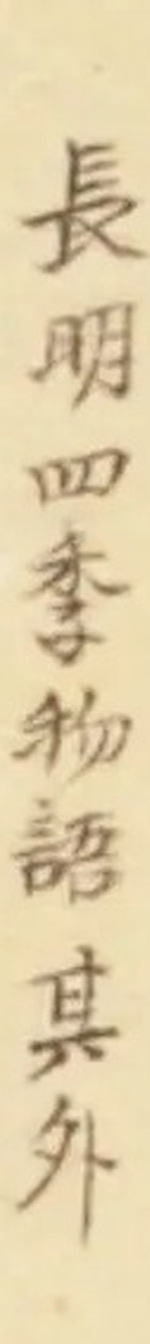長明四季物語其他
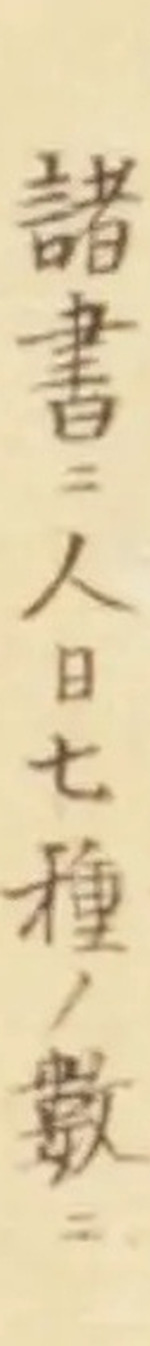諸書ニ人日七種ノ數ニ
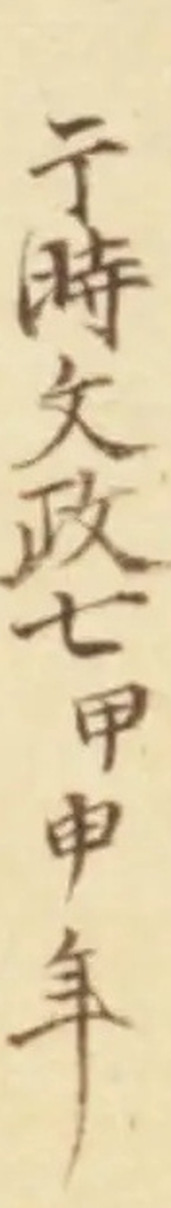于時文政七甲申年
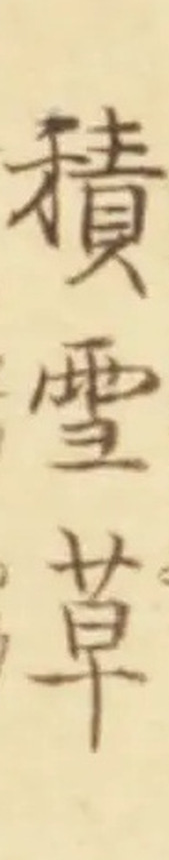積雪草
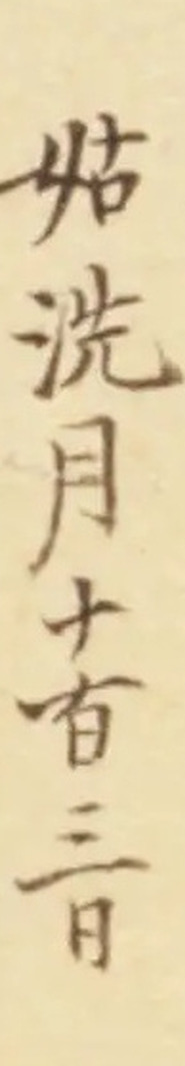姑洗十有三日
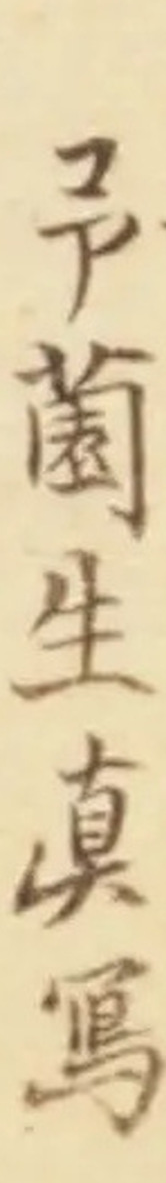予園生真写
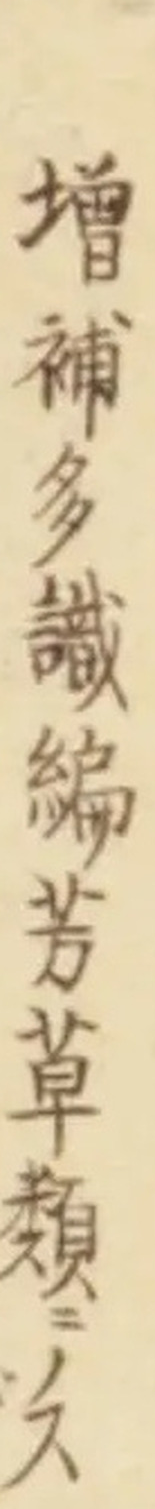増補多識編芳草類ニノス
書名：梅園草木花譜春之部. 1
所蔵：国立国会図書館 National Diet Library, JAPAN
